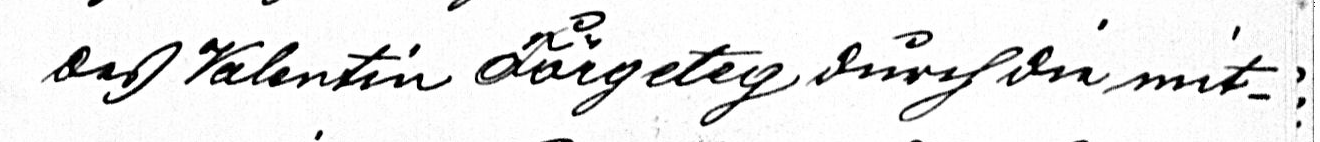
des Valentin Förgeteg durch die mit¬
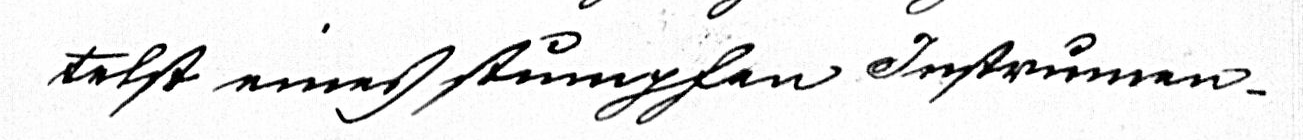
telst eines stumpfen Instrumentes
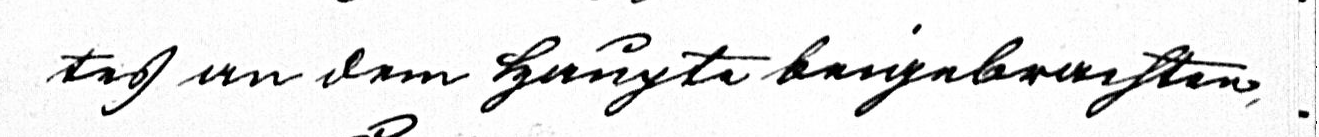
an dem Haupte beigebrachten
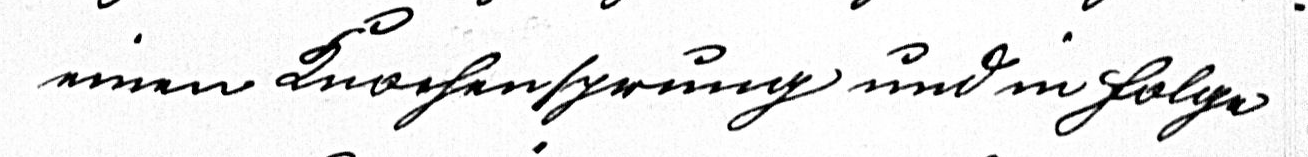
einen Knochensprung und in Folge
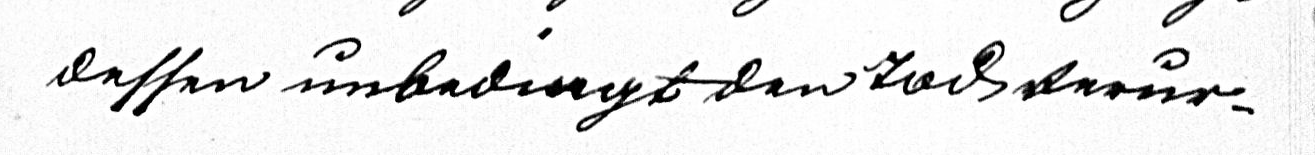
dessen unbedingt den Tod verur¬
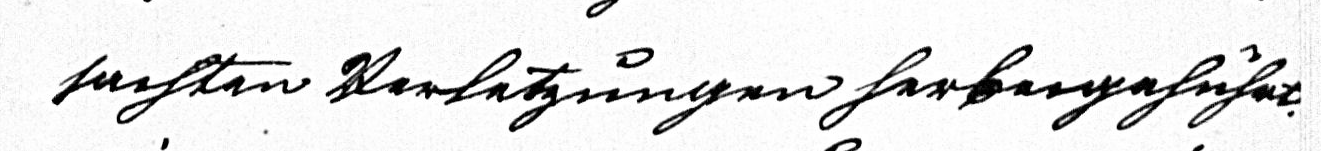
sachten Verletzungen herbeigeführt.
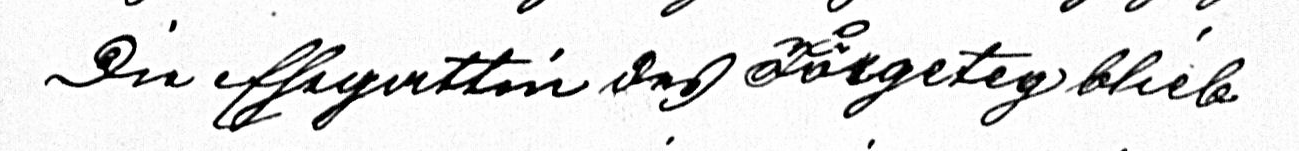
Die Ehegattin des Förgeteg blieb
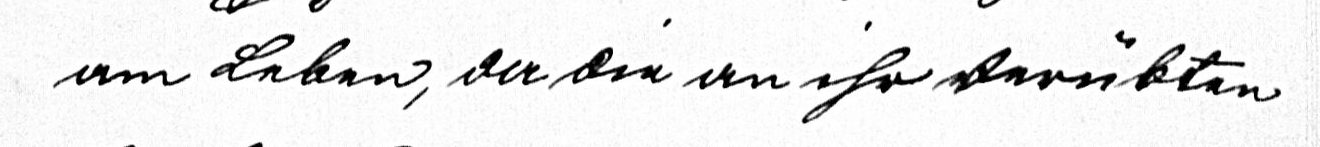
am Leben, da die an ihr verübten
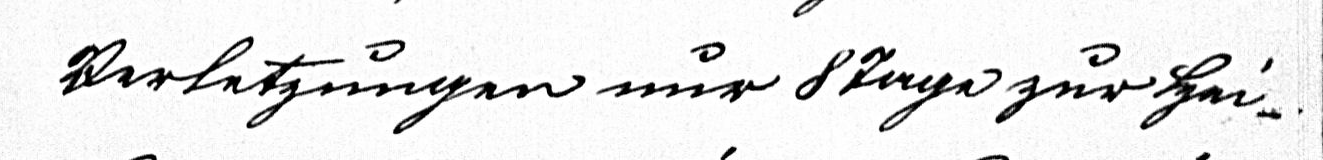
Verletzungen nur 8 Tage zur Hei¬
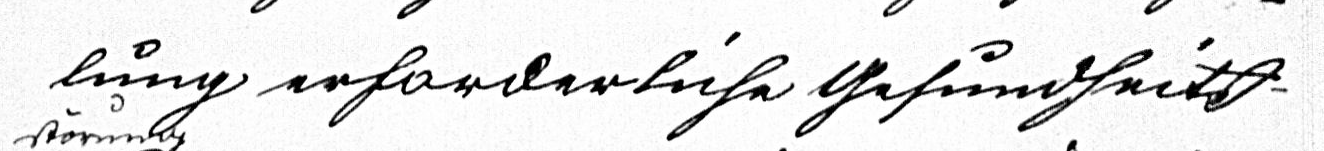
lung erforderliche Gesundheits
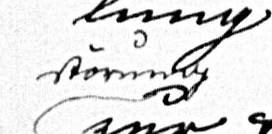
störung
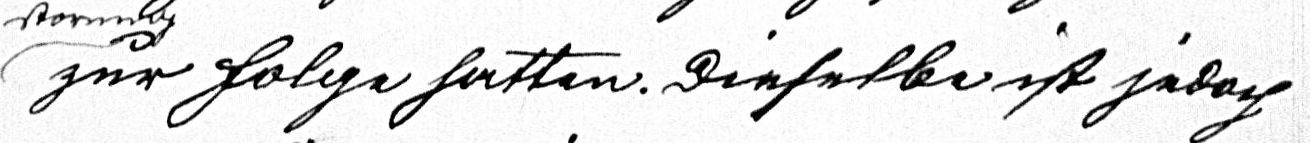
zur Folge hatten. Dieselbe ist jedoch
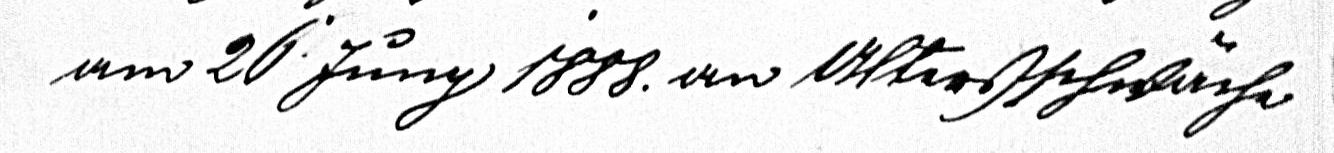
am 26. Juny 1888. an Altersschwäche
